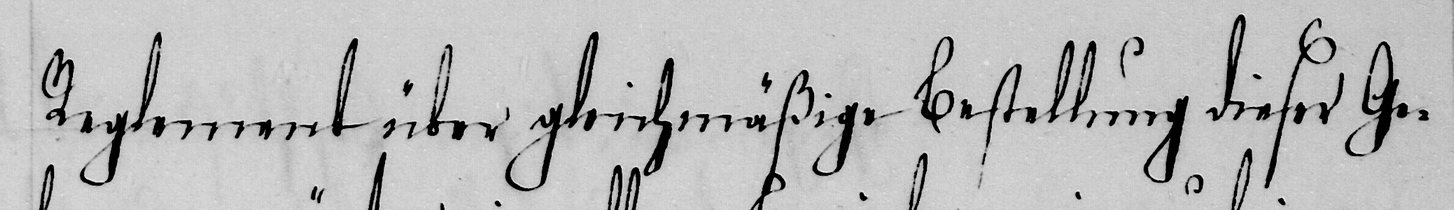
Reglement über gleichmäßige Bestellung dieser Ge¬
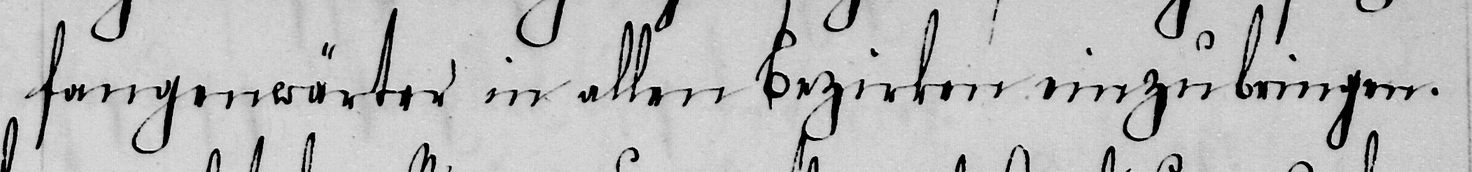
fangenwärter in allen Bezirken einzubringen.
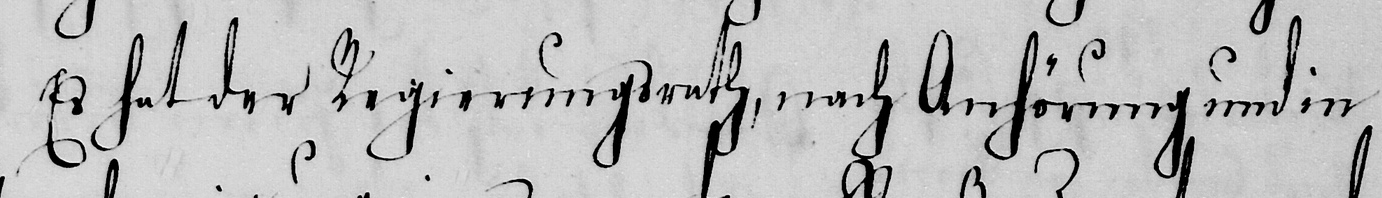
Es hat der Regierungsrath, nach Anhörung und in
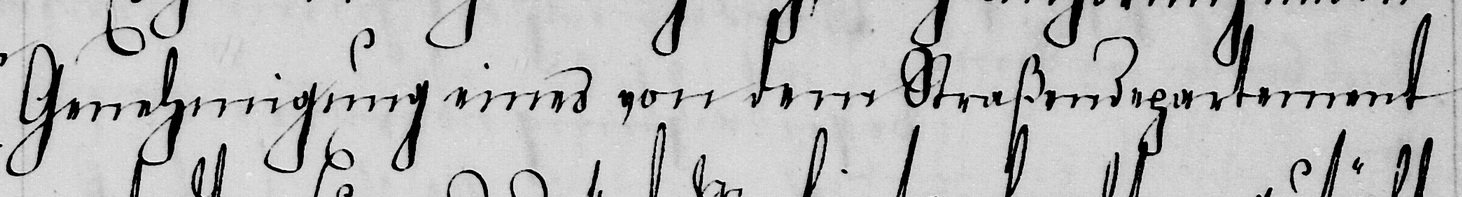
Genehmigung eines von dem Straßendepartement
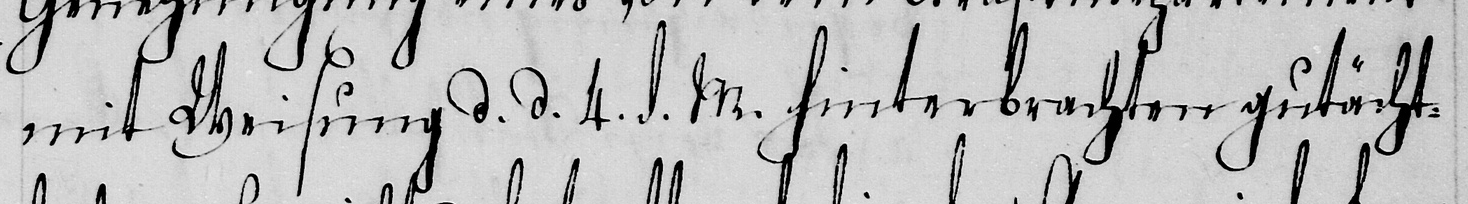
mit Weisung d. d. 4. d. M. hinterbrachten gutächt¬
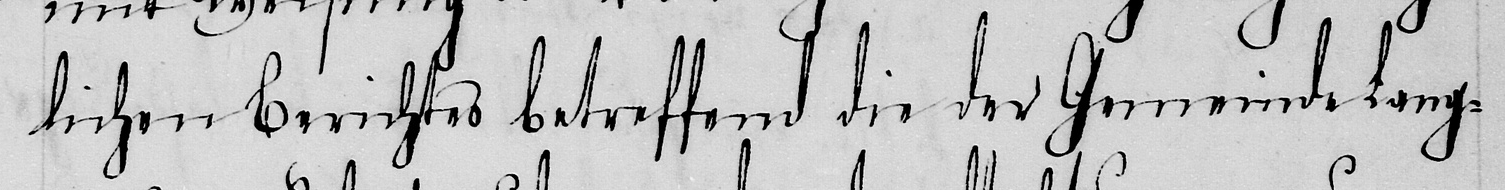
lichen Berichtes betreffend die der Gemeinde Lang¬
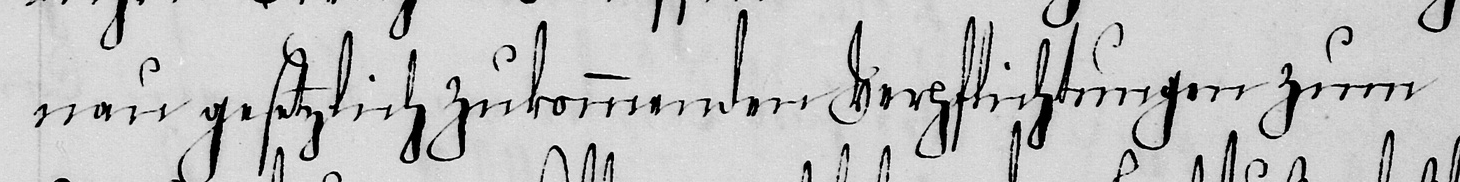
nau gesetzlich zukommenden Verpflichtungen zum
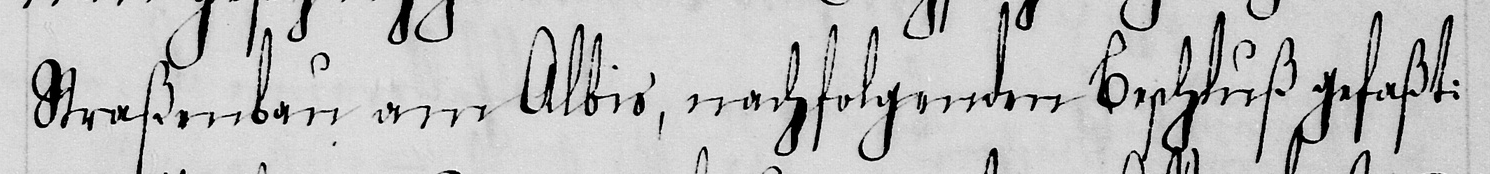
Straßenbau am Albis, nachfolgenden Beschluß gefaßt:
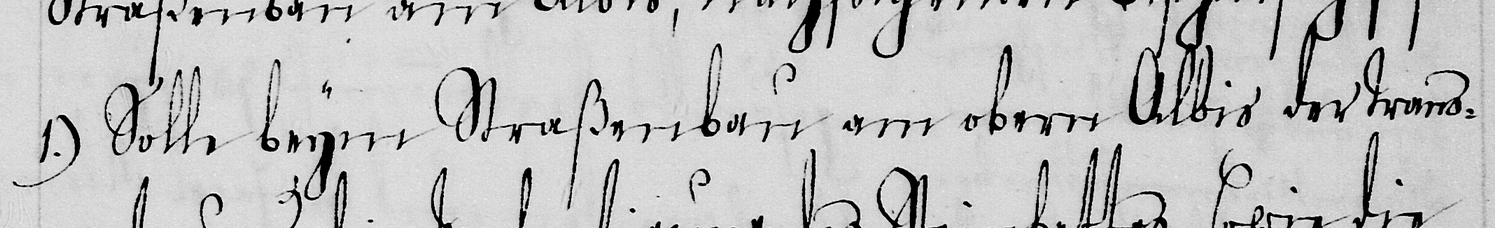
1.) Solle beym Straßenbau am obern Albis der Trans¬
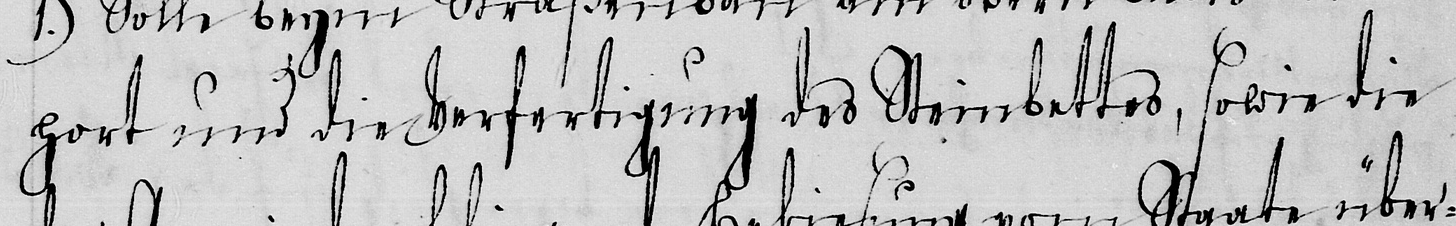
port und die Verfertigung des Steinbettes, sowie die
